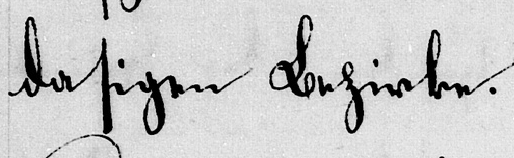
dasigen Bezirke¬
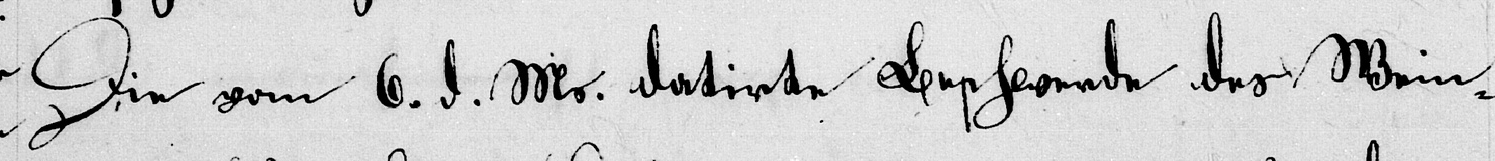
Die vom 6. d. Ms. datirte Beschwerde des Wein¬
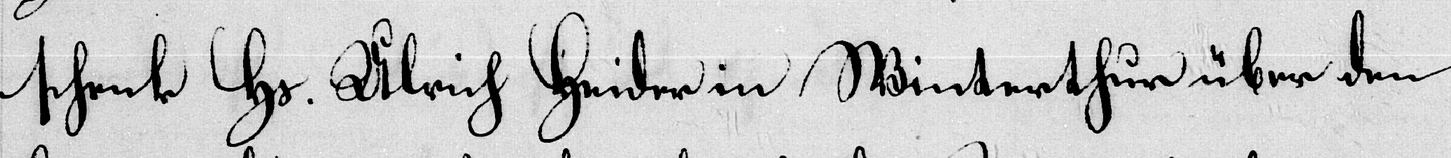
schenk Hs. Ulrich Heider in Winterthur über den
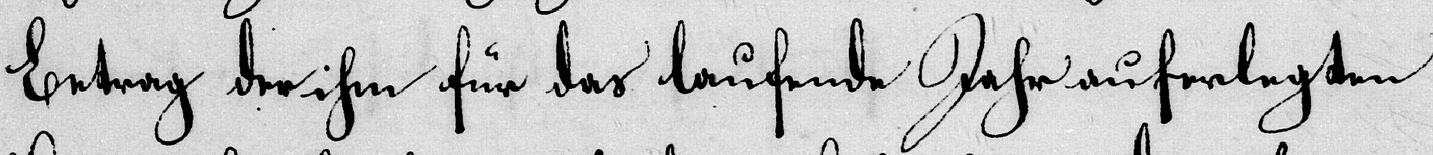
Betrag der ihm für das laufende Jahr auferlegten
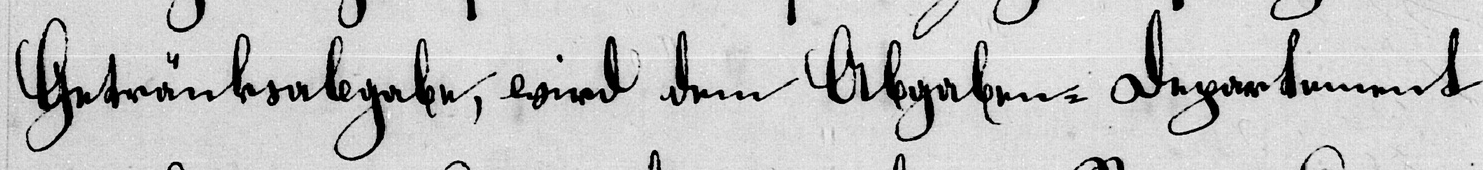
Getränksabgabe, wird dem Abgaben-Departement
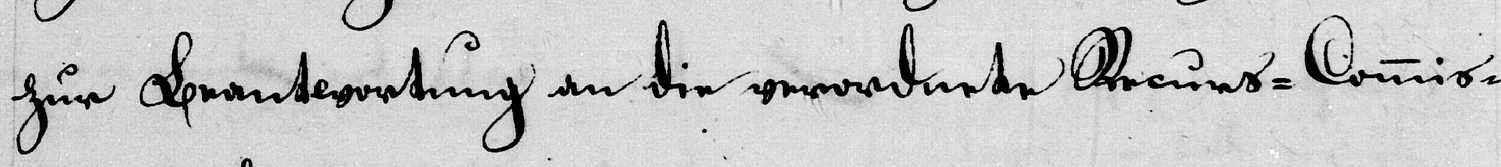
zur Beantwortung an die verordnete Recurs-Commis¬
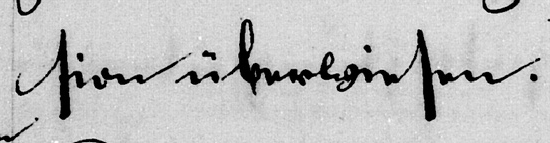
sion überwiesen.
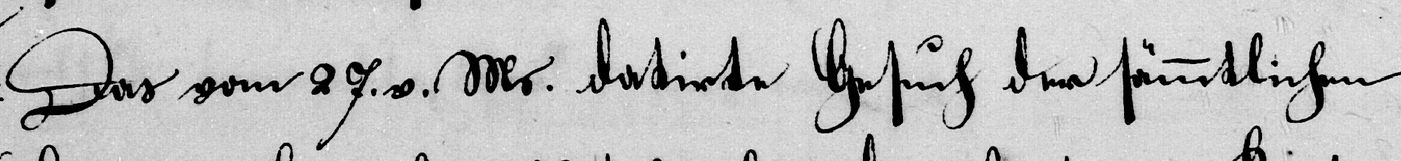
Das vom 27. v. Ms. datirte Gesuch der sämmtlichen
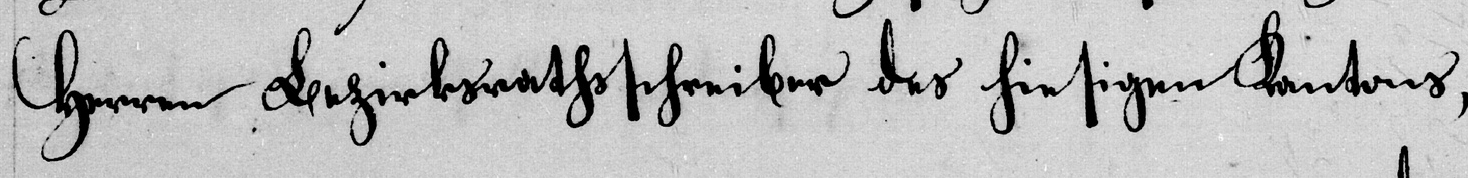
Herren Bezirksrathsschreiber des hiesigen Kantons,
